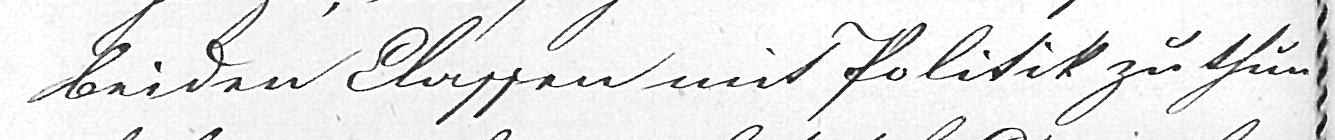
beiden Classen und Politik zu thun
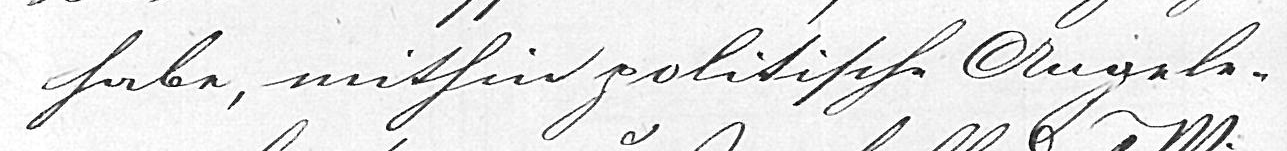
habe, mithin politische Angele-
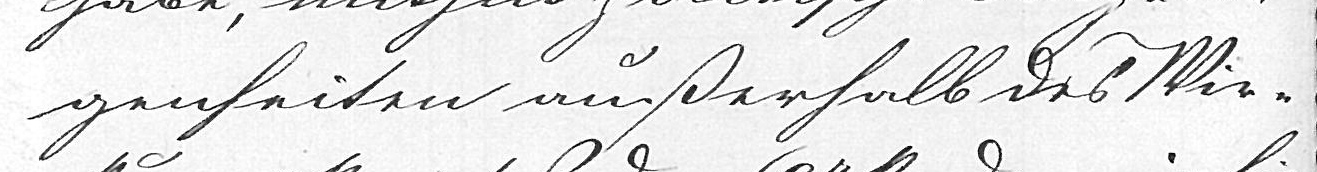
genheiten außerhalb des Wir-
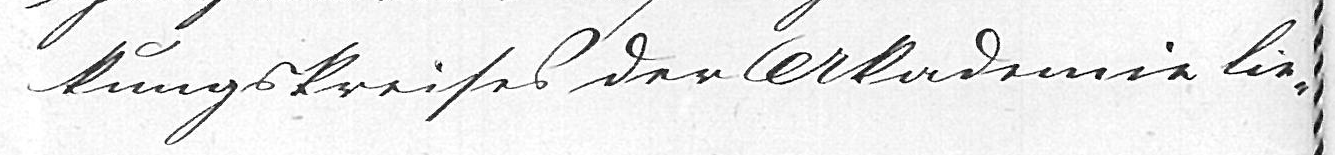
kungskreises der Akademie lie-
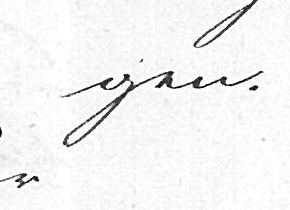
gen.
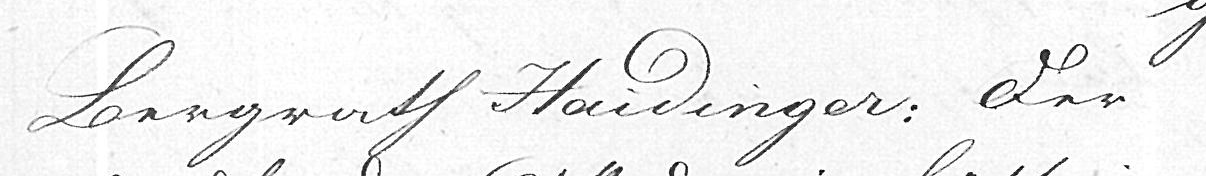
Bergrath Haidinger: Der
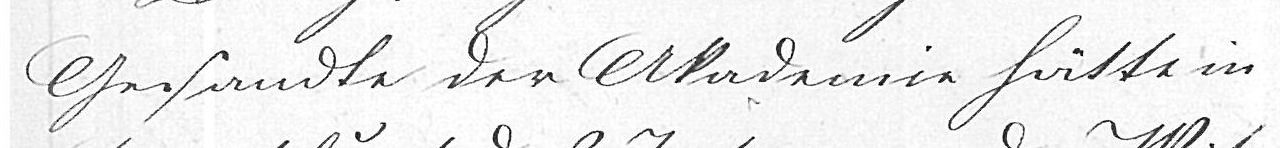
Gesandte der Akademie hätte in
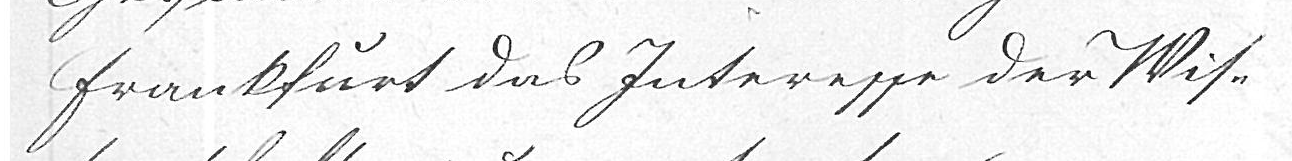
Frankfurt das Interesse der Wis-
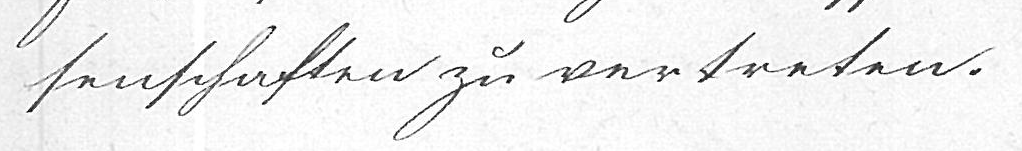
senschaften zu vertreten.
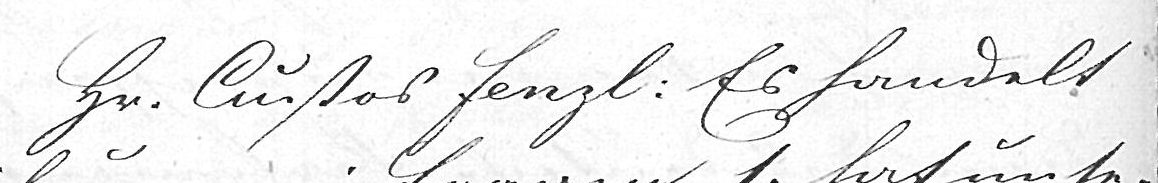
Hr. Custos Fenzl: Es handelt
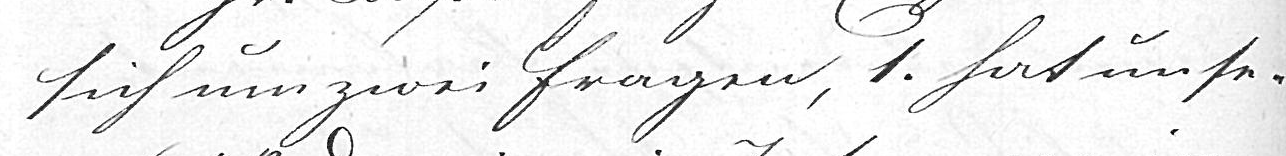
sich um zwei Fragen, 1. hat unse-
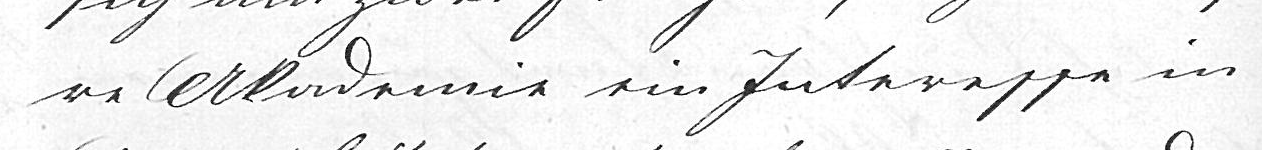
re Akademie ein Interesse in
